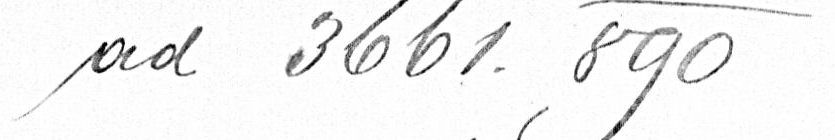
ad 3661. 890
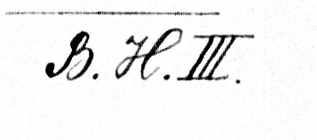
B.H.III.
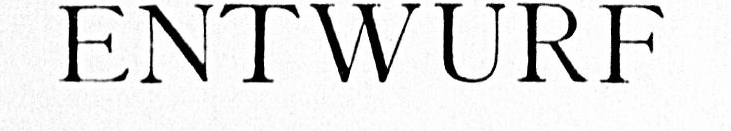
ENTWURF
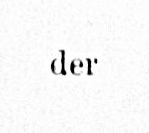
der
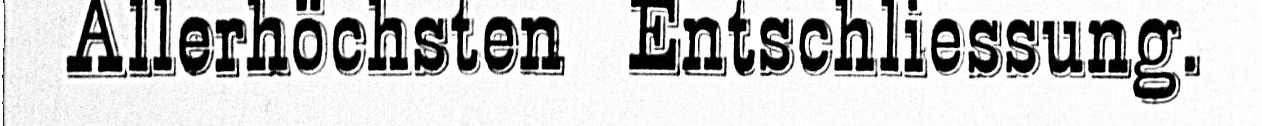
Allerhöchsten Entschliessung.
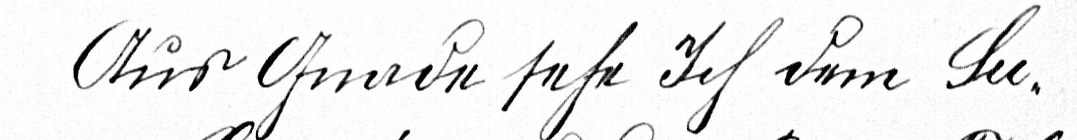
Aus Gnade sehr Ich dem Su¬
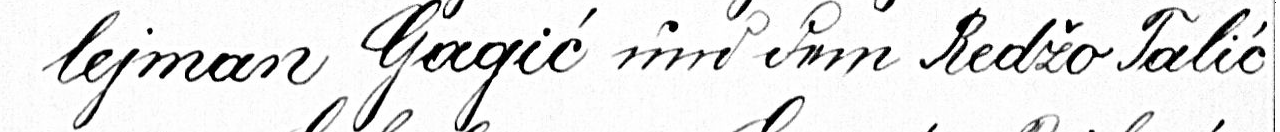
lejman Gagić und dem Redžo Talić
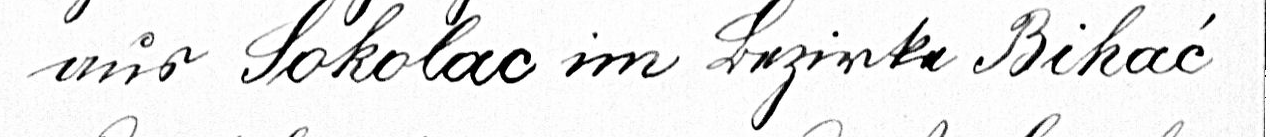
aus Sokolac im Bezirke Bihać
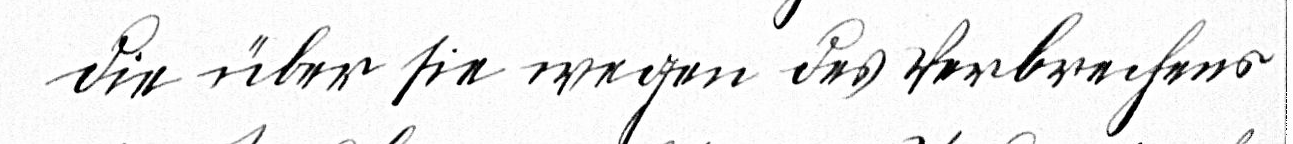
die über sie wegen des Verbrechens
